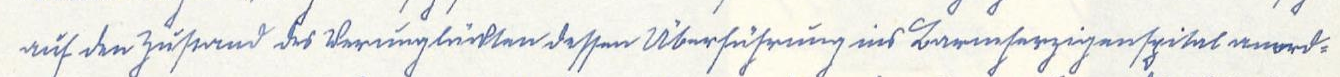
auf den Zustand des Verunglückten dessen Überführung ins Barmherzigenspital verord-
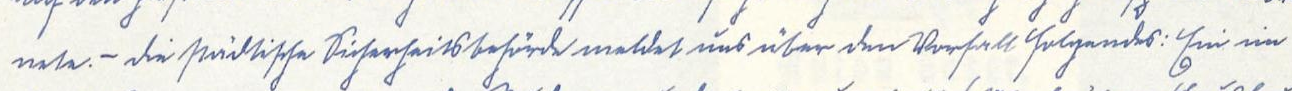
nete.- Die städtische Sicherheitsbehörde meldet uns über den Vorfall folgendes: Ein im
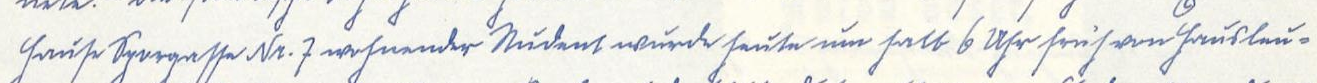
Hause Sporgasse Nr. 7 wohnender Student wurde heute um halb 6 Uhr früh von Hausleu-
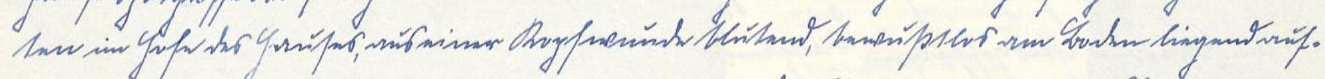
ten im Hofe des Hauses, aus einer Kopfwunde blutend, bewusstlos am Boden liegend auf-
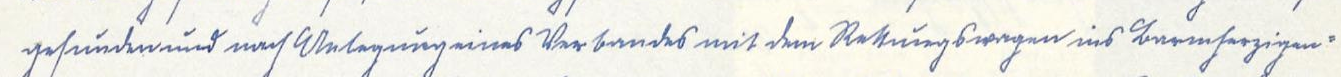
gefunden und nach Anlegung eines Verbandes mit dem Rettungswagen ins Barmherzigen-
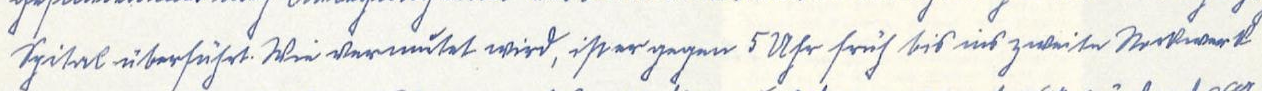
Spital überführt. Wie vermutet wird, ist ergegen 5 Uhr früh bis ins zweite Stockwerk
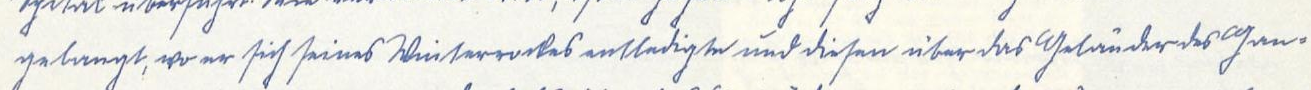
gelangt, wo er sich seines Winterrockes entledigte und diesen über das Geländer des Gan-
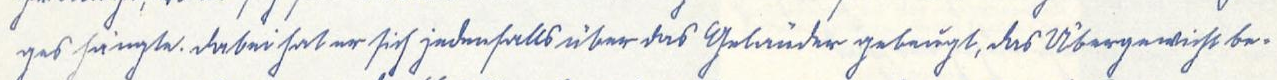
ges hängte. Dabei hatte sich jedenfalls über das Geländer gehängt, das Übergewicht be-
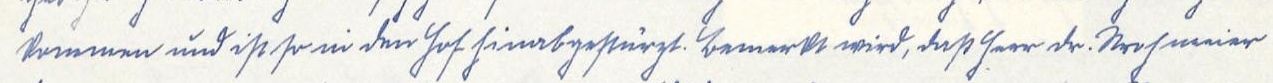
kommen und ist so in den Hof hinabgestürzt. Bemerkt wird, dass er Dr. Strohmaier
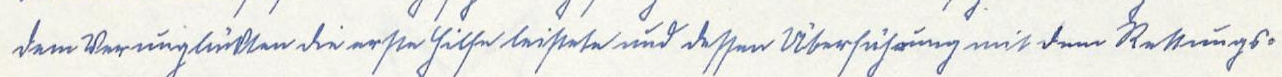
dem Verunglückten die erste Hilfe leistete und dessen Überführung mit dem Rettungs-
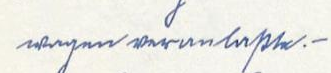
wagen veranlaßte.
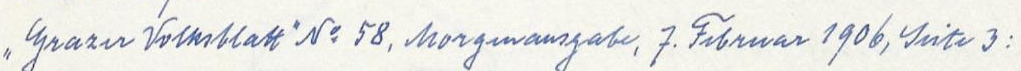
„Grazer Volksblatt„ Nr. 58, Morgenausgabe, 7. Februar 1906, Seite 3:
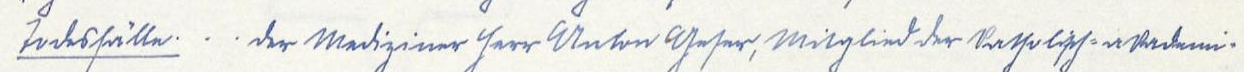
Todesfälle: … der Mediziner Herr Anton Geser, Mitglied der katholisch-akademi
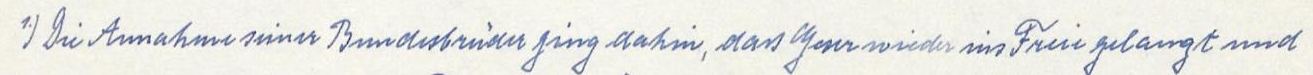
1) Die Annahme seiner Bundesbrüder ging dahin, dass Geser wieder ins Freie gelangt und
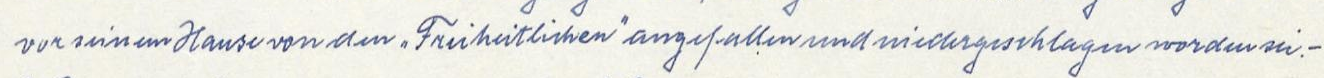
vor seinem Hause von den „Freiheitlichen“ angefallen und niedergeschlagen worden sei.-
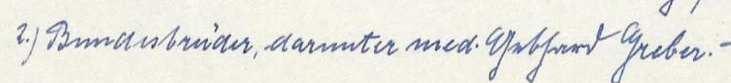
2) Bundesbrüder, darunter med. Gebhard Greber.-
